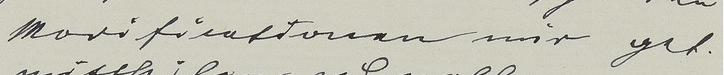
Modificationen mir gef.
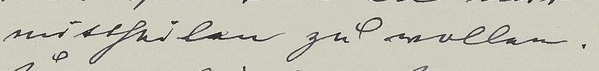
mittheilen zu wollen.
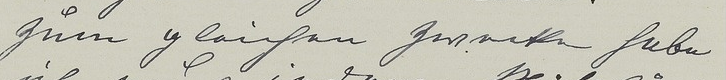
Zum gleichen Zwecke habe
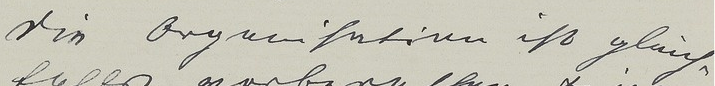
Die Organisation ist gleich-
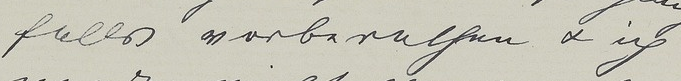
falls vorberathen & ich
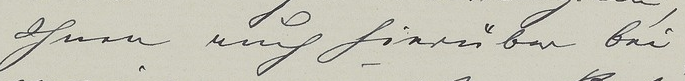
Ihnen auch hierüber bei
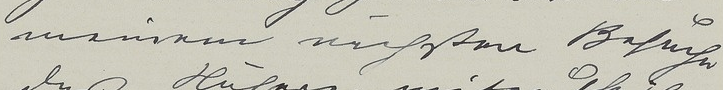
meinem nächsten Besuche
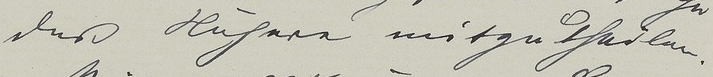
das Nähere mitzutheilen.
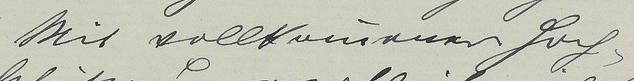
Mit vollkommener Hoch-
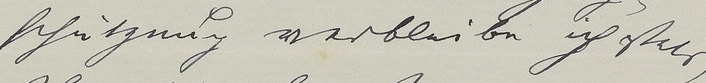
schätzung verbleibe ich stets,
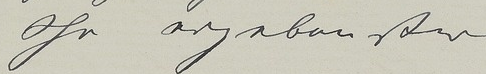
Ihr ergebenster
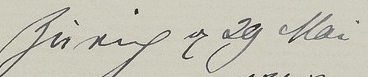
Zürich den 29 Mai
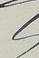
1878.
